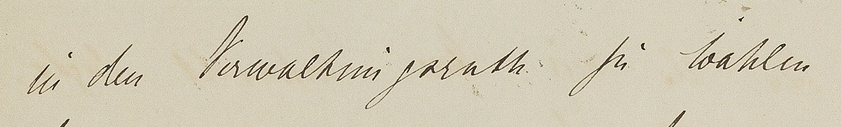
in den Verwaltungsrath zu wählen
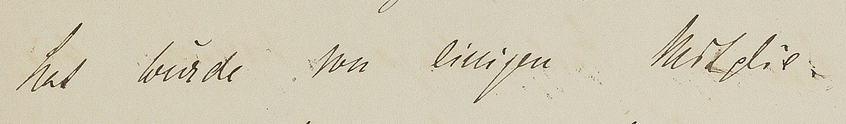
hat wurde von einigen Mitglie-
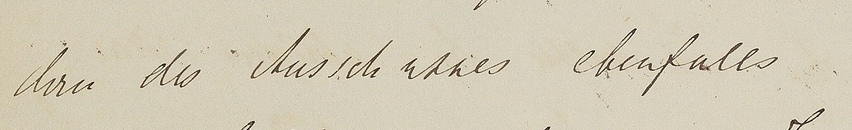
dern des Ausschusses ebenfalls
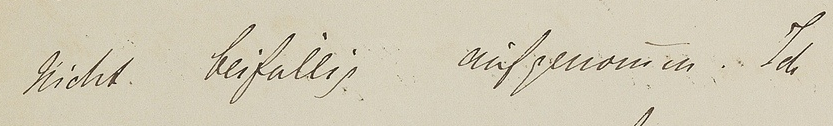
nicht beifällig aufgenommen. Ich
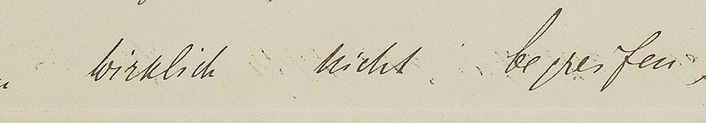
wirklich nicht begreifen,
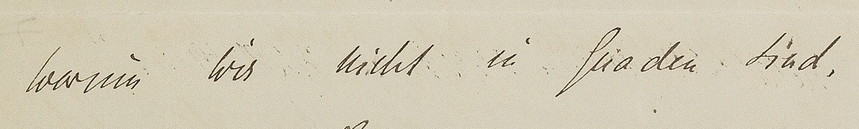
warum wir nicht in Gnaden sind.
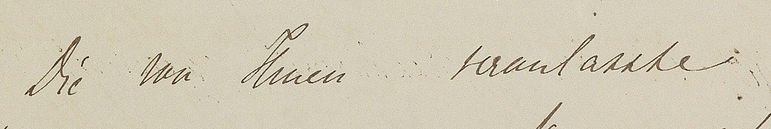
Die von Ihnen veranlasste
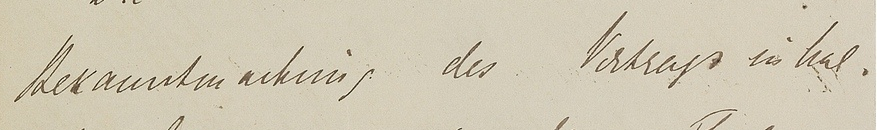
Bekanntmachung des Vertragsinhal-
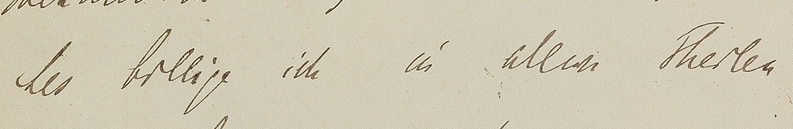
tes billige ich in allen Theilen.
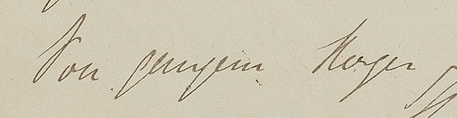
Von ganzem Herzen
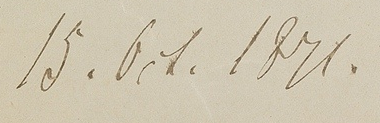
15. Oct. 1871.
